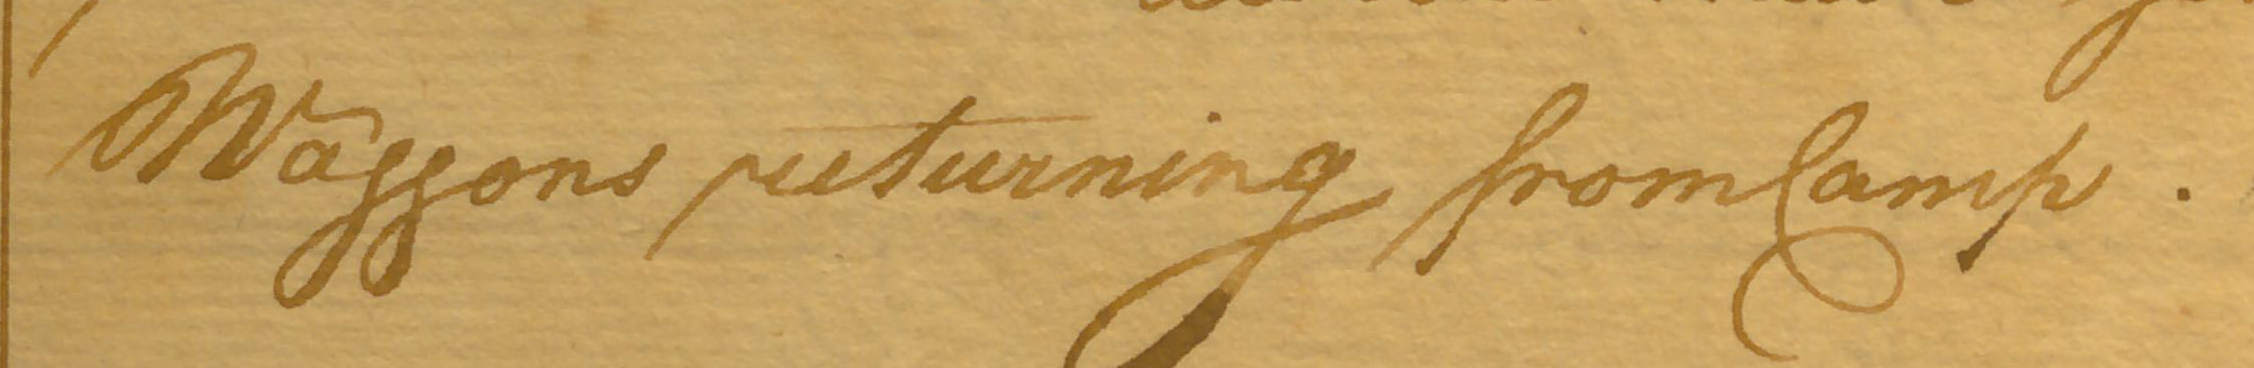Waggons returning from Camp.
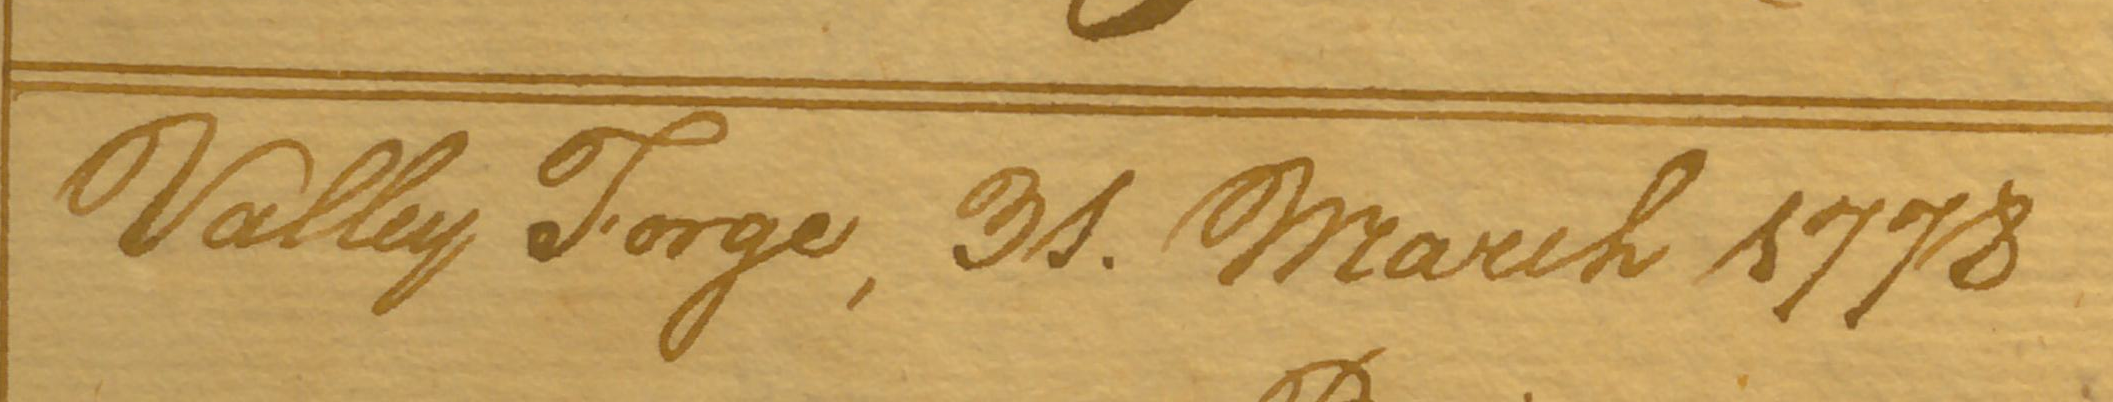Valley Forge, 31. March 1778
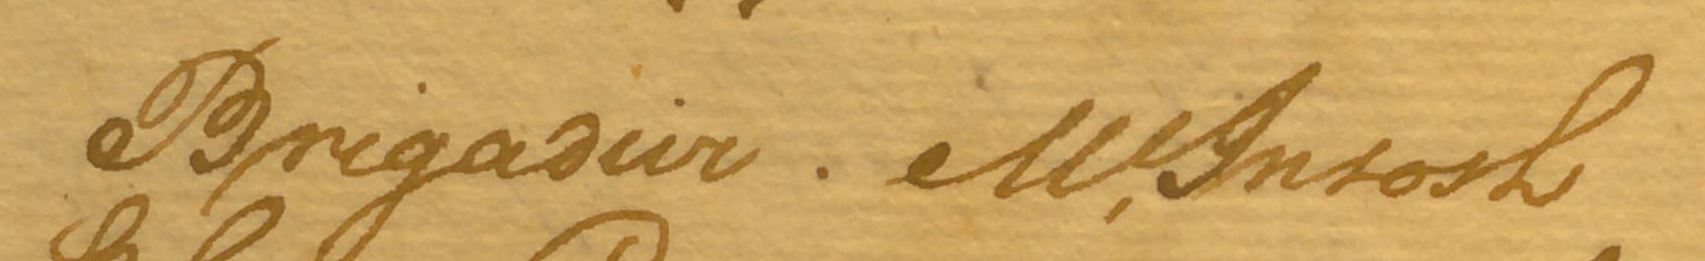Brigadier. M^c.Intosh
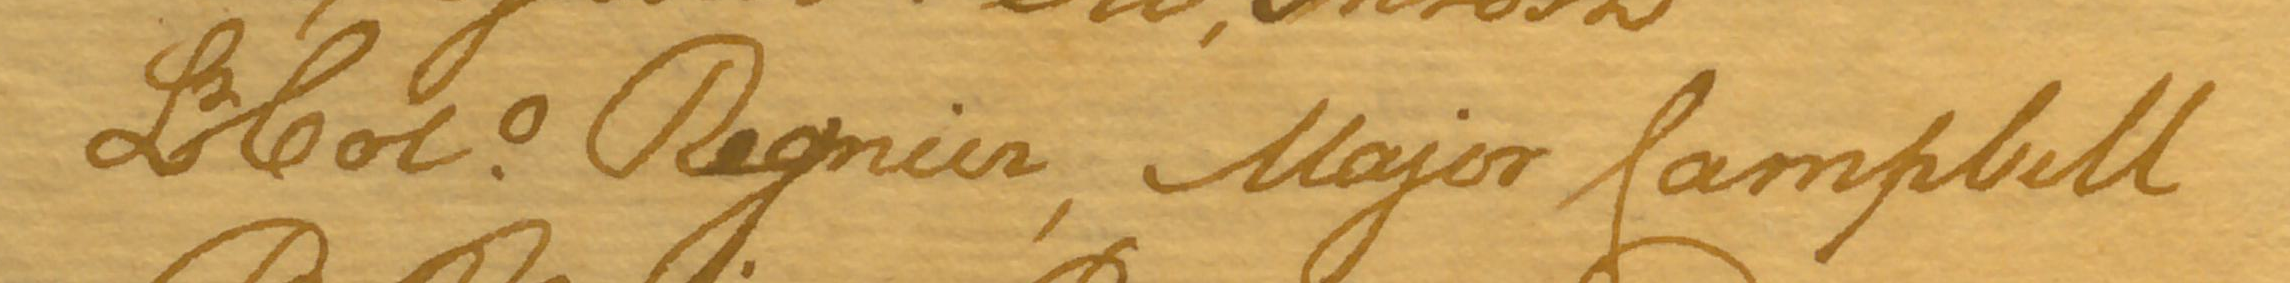L^t. Col^o. Regnier, Major Campbell
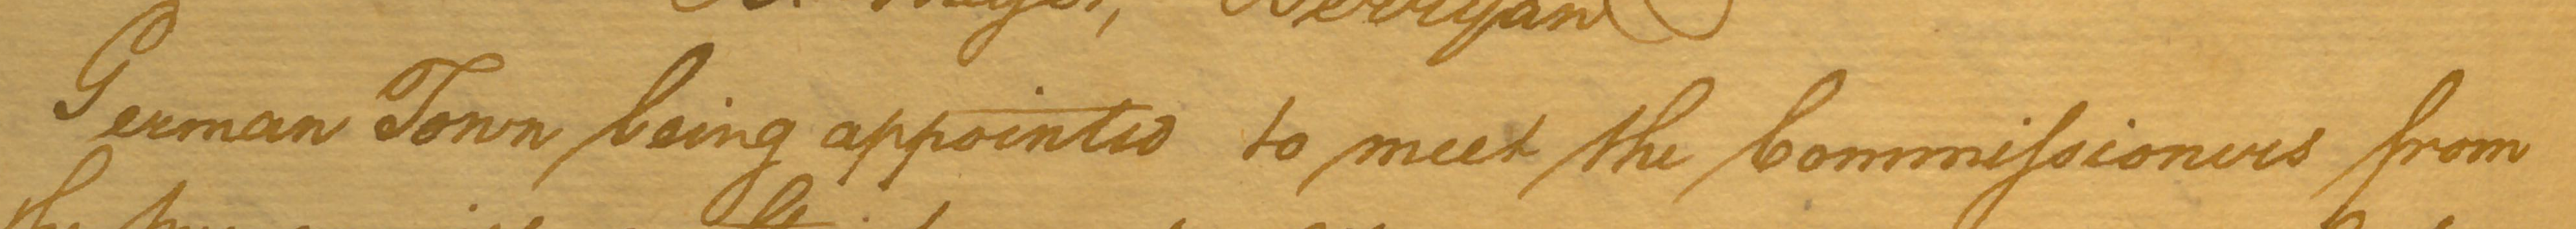German Town being appointed to meet the Commissioners from
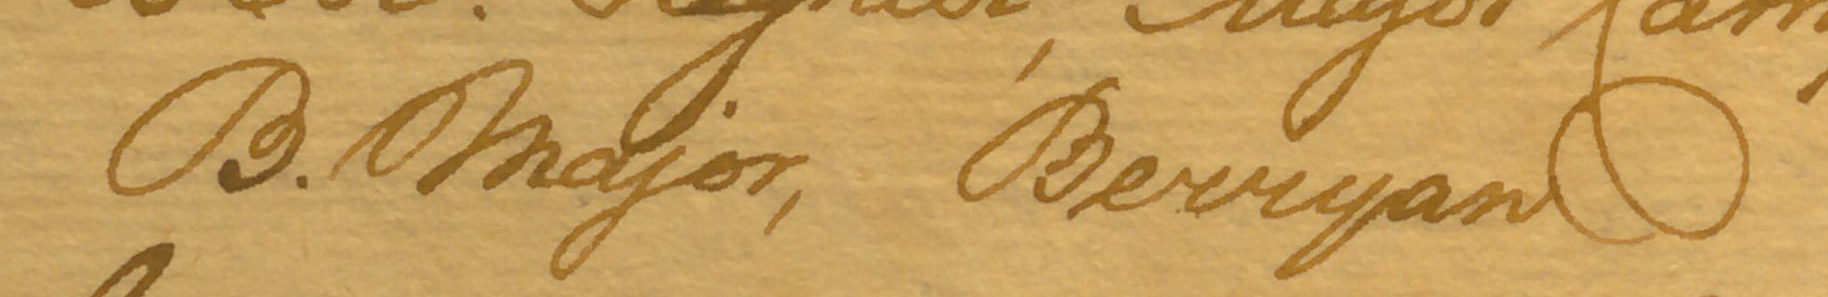B. Major, Berryan
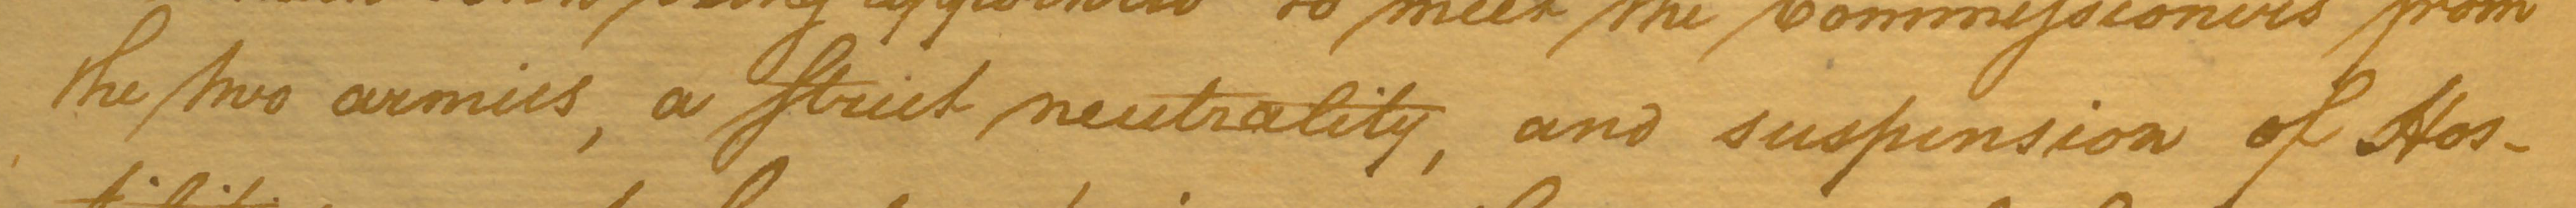the two armies, a strict neutrality, and suspension of Hos-
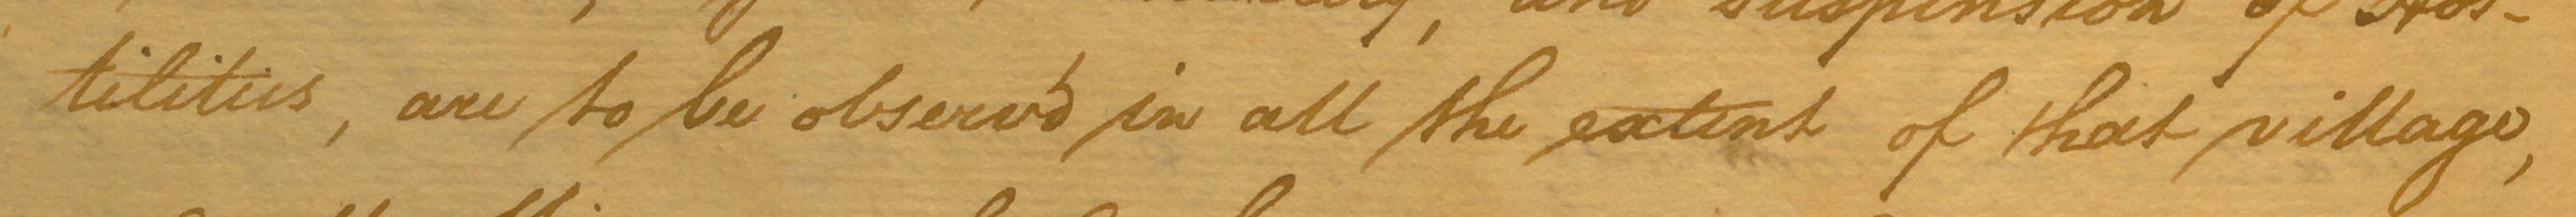tilities, are to be observ'd in all the extent of that village,
